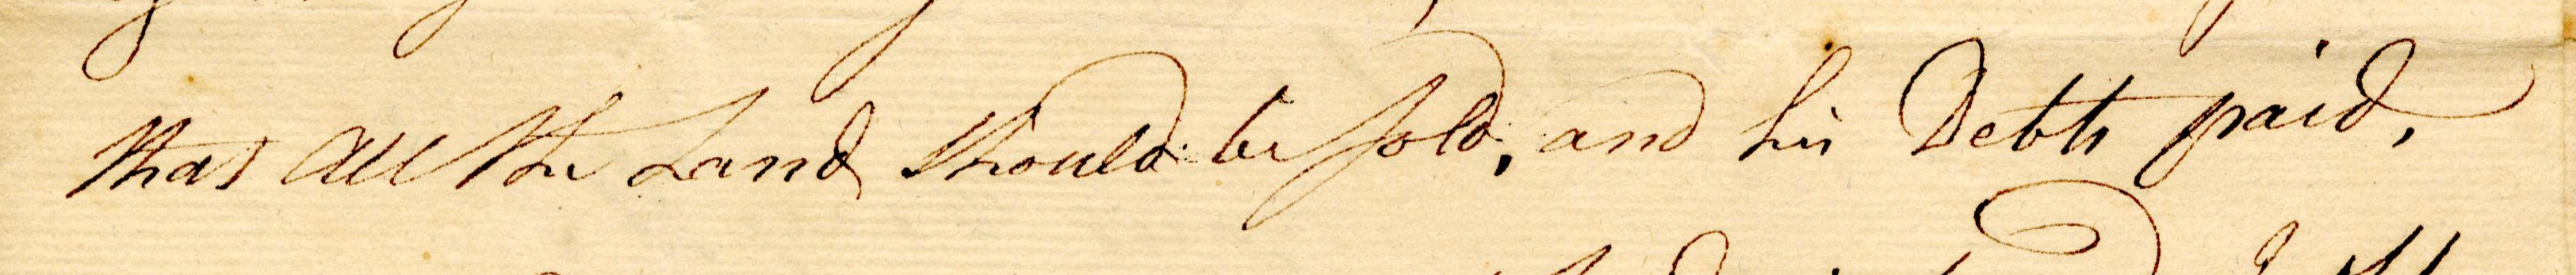that all the Lands should be sold, and his Debts paid,
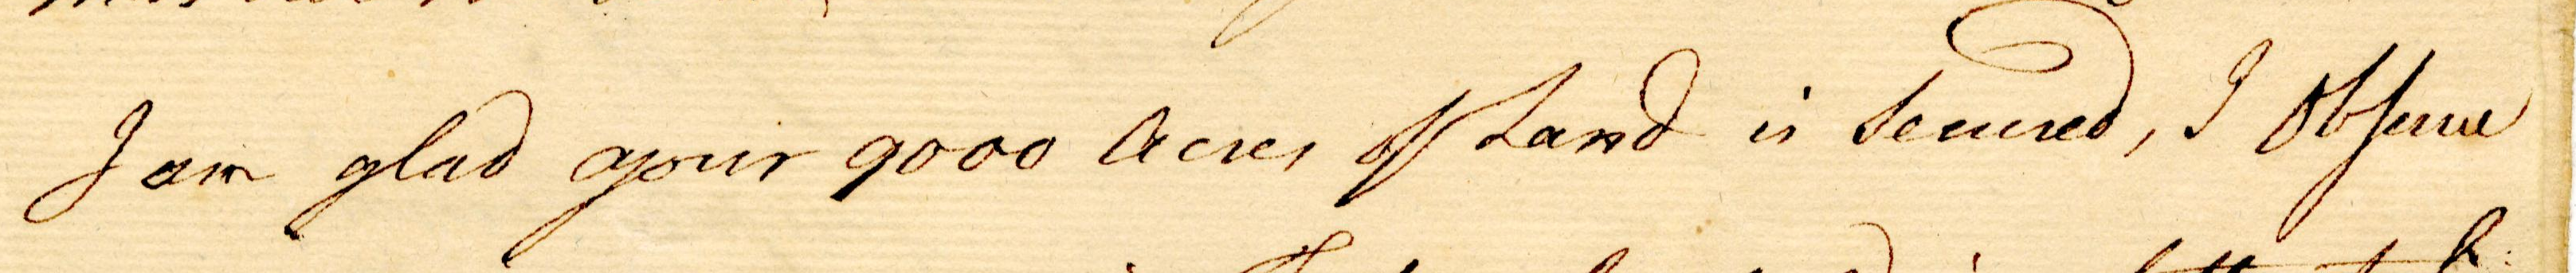I am glad your 9000 Acres of Land, is secured, I observe
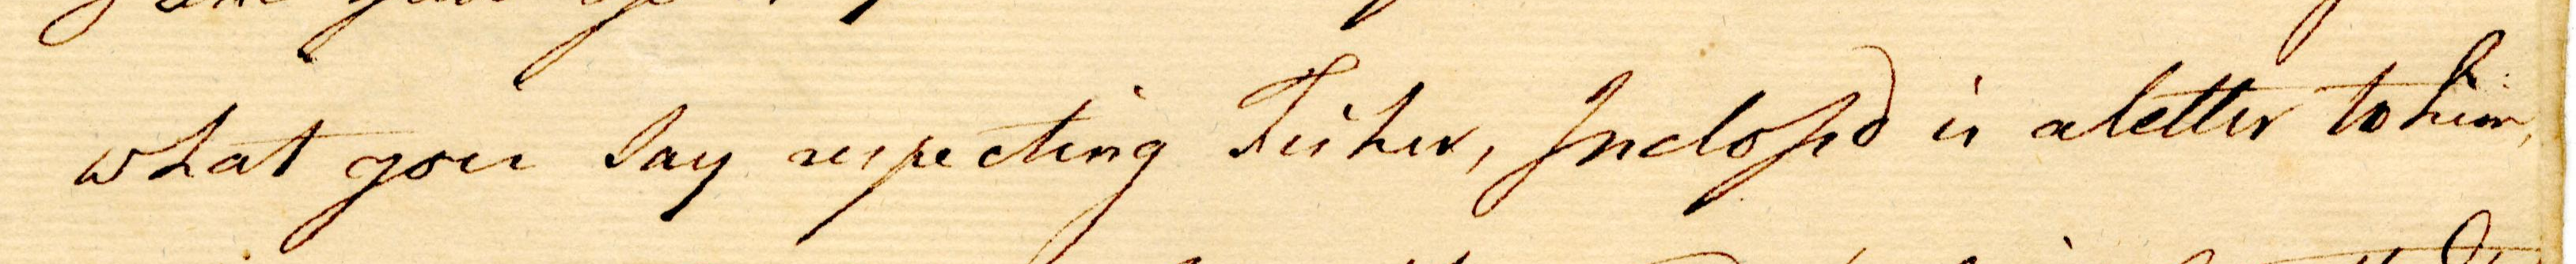what you say respecting Fisher, Inclosed is a letter to him
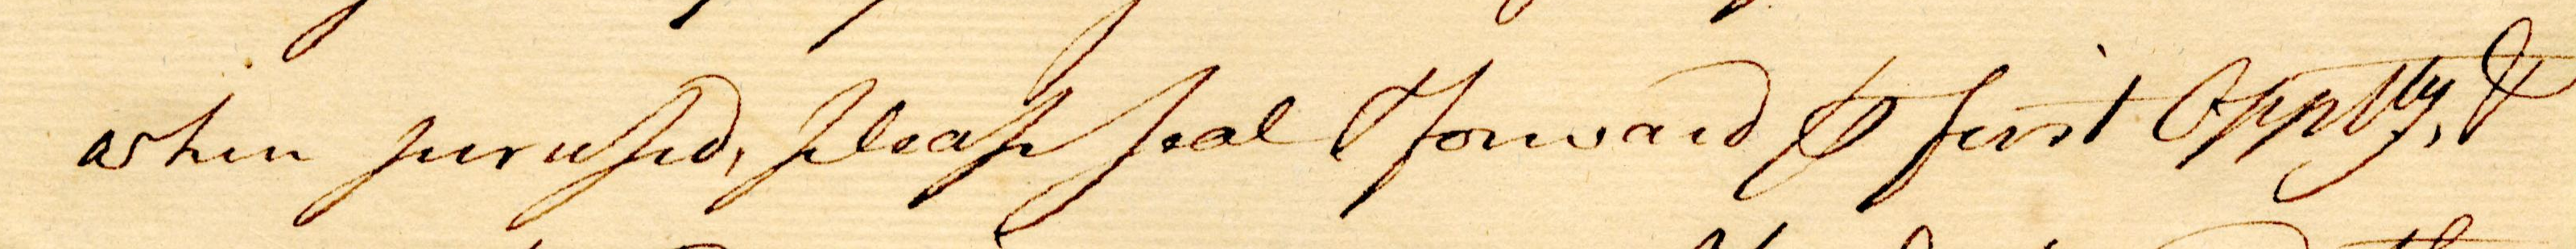when perused, please seal & forward per first Opp^ty &
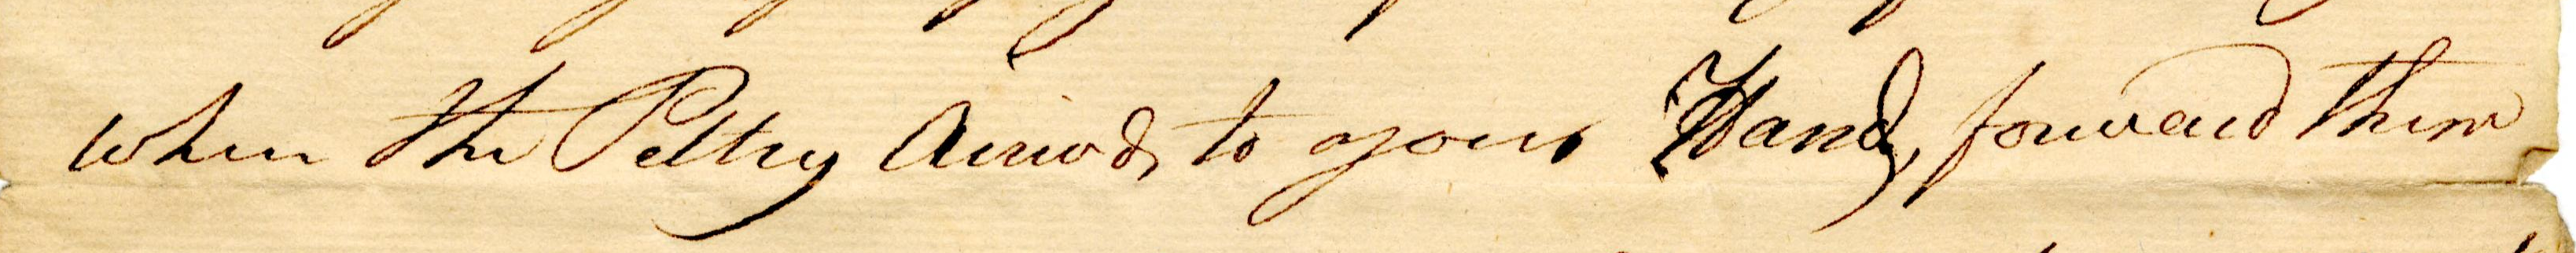when the Peltry Arriv^d, to your Hand, forward them
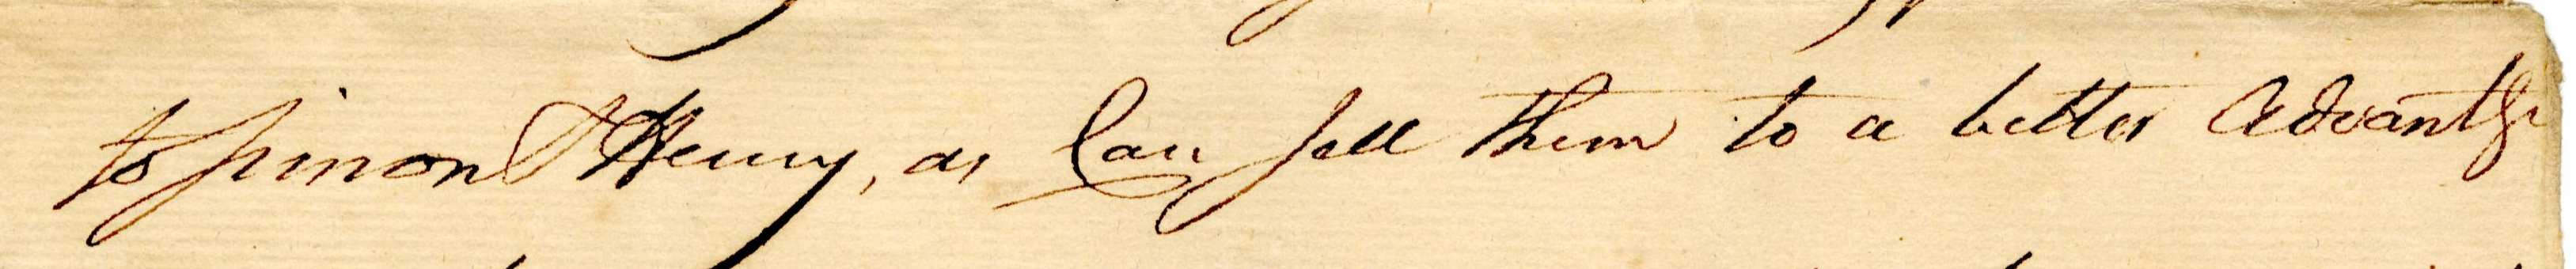to Simon & Henry, as Can sell them to a better Advant^ge
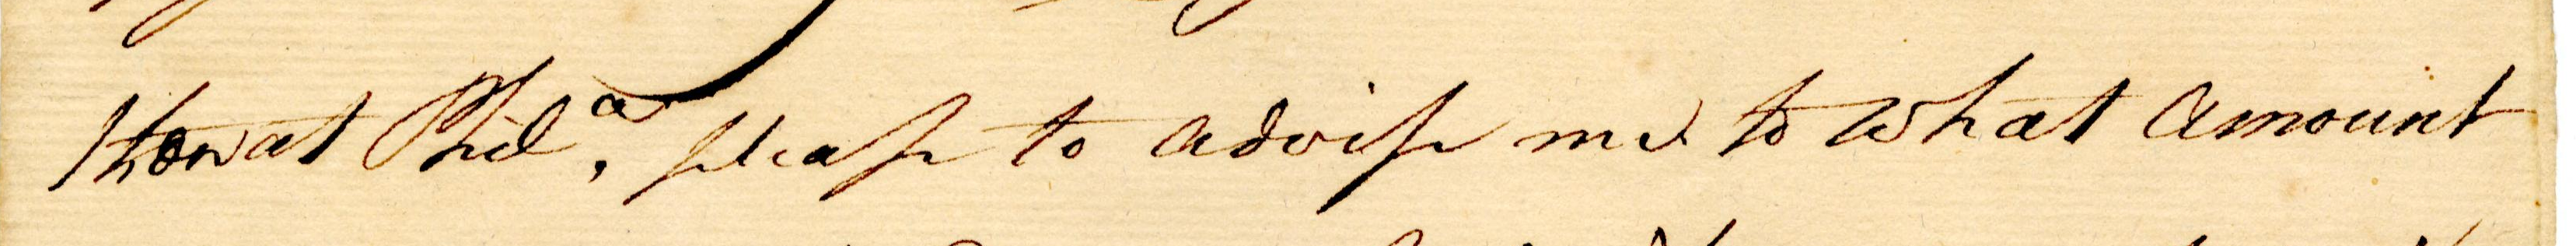than at Phil^a. please to advise me to what amount
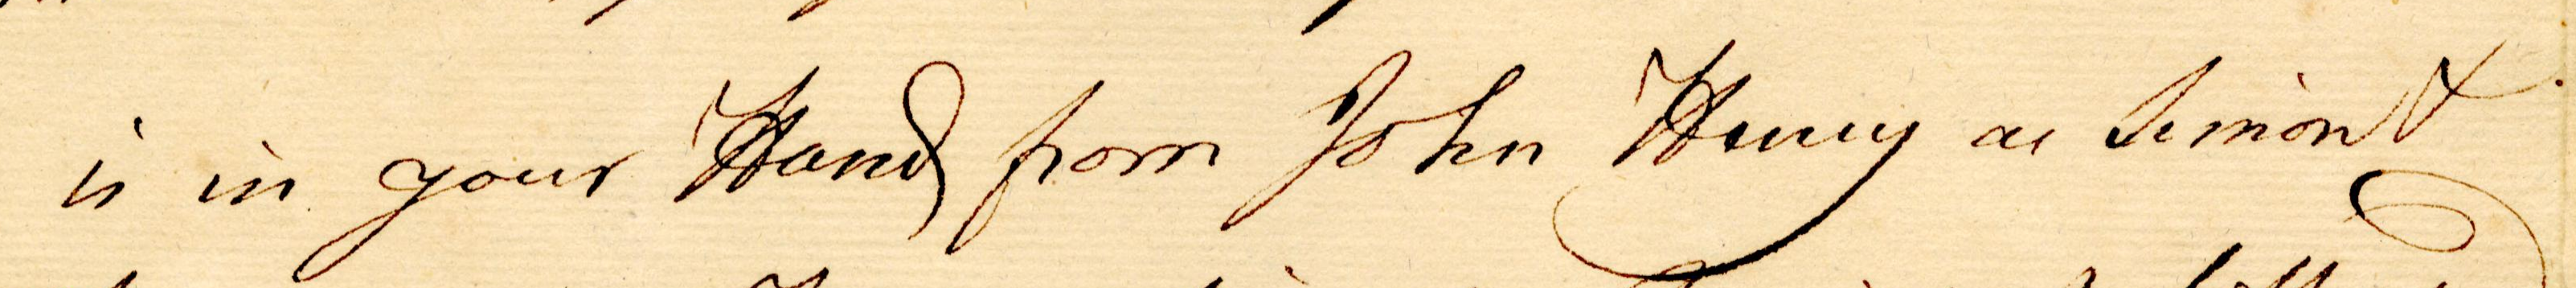is in your Hand from John Henry as Simon &
